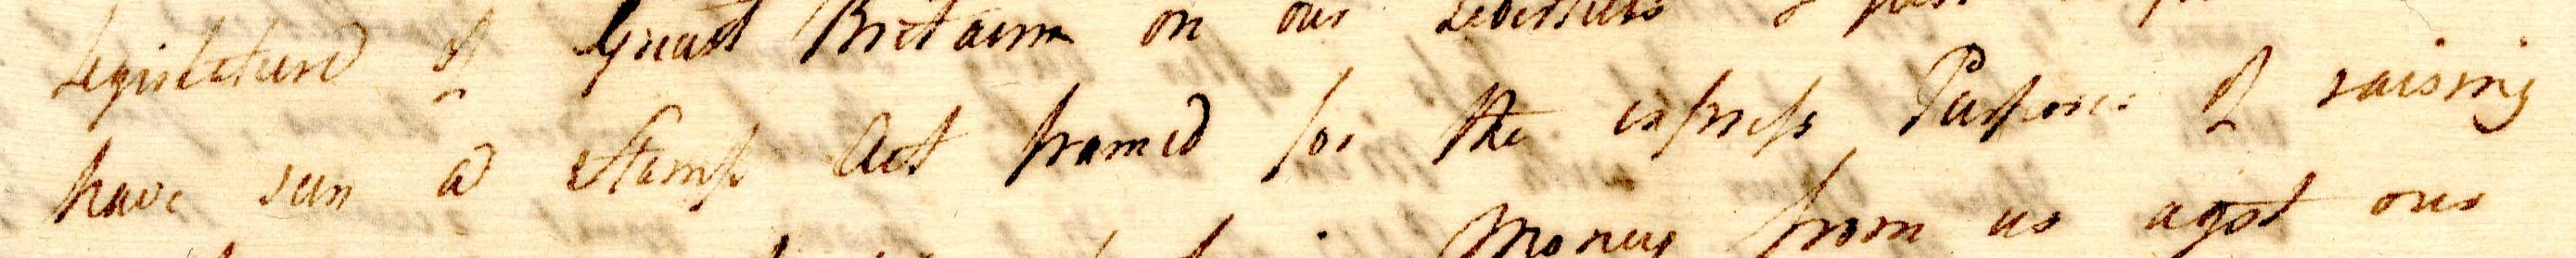have seen a Stamp Act framed for the express Purpose & raising
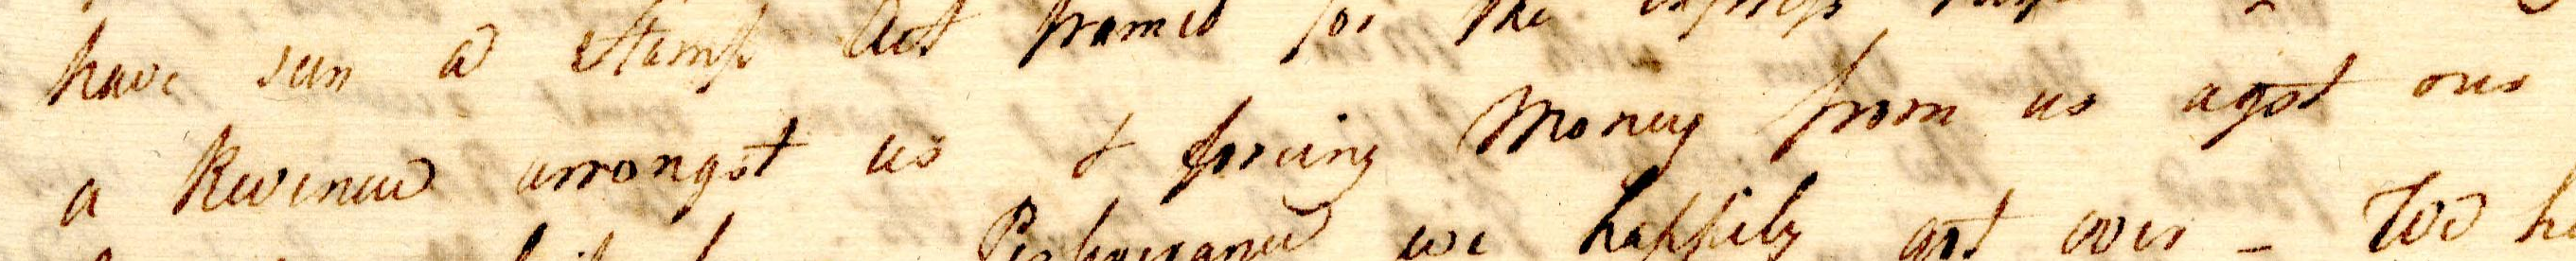a Revenue amongst us & forcing Money from us agst our
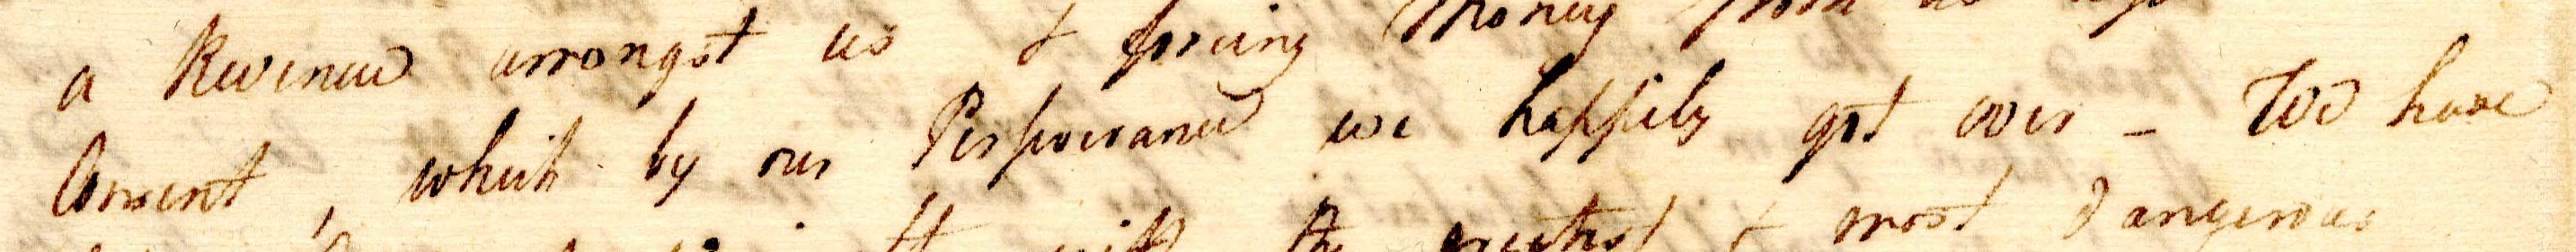Consent, which by our Perseverance we happily got over. We have
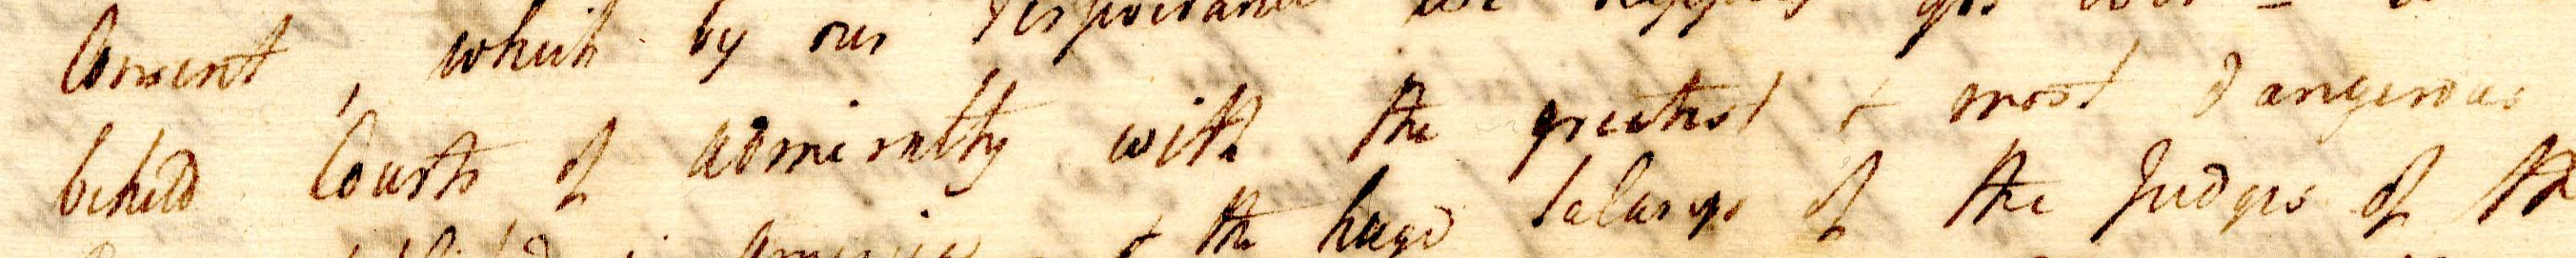beheld Court & admiralty with the greatest & most dangerous
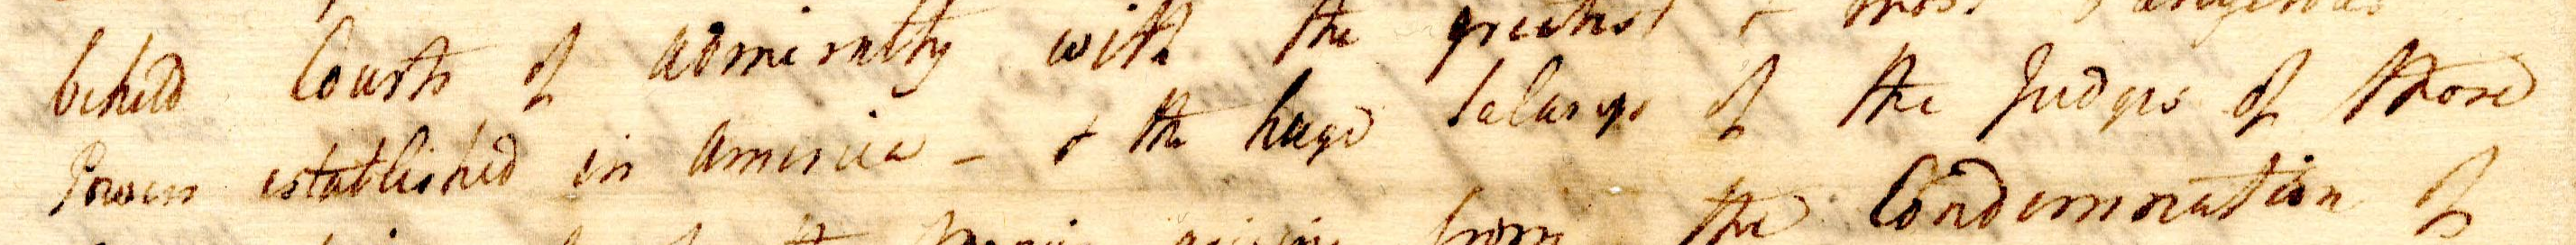Powers established in America & the hage Salanya of the Judges of those
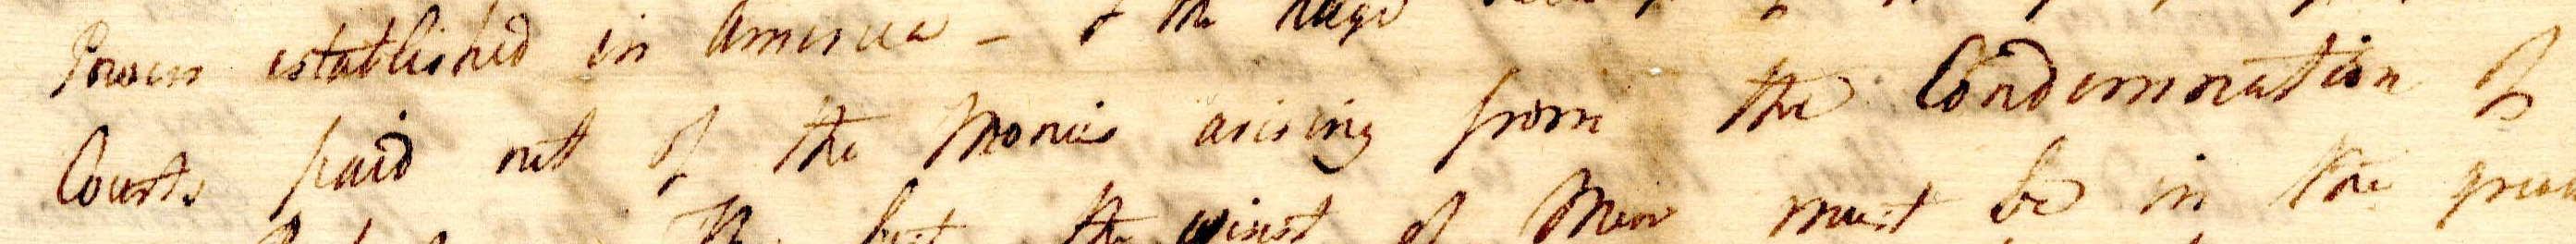Courts paid not of the mores arising from the Condemnation of
